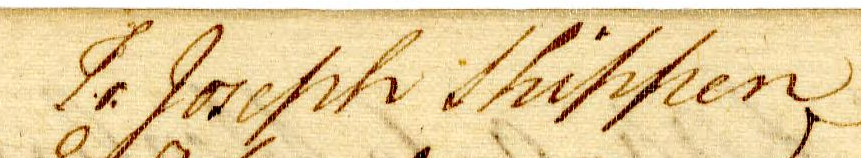To Joseph Shippen
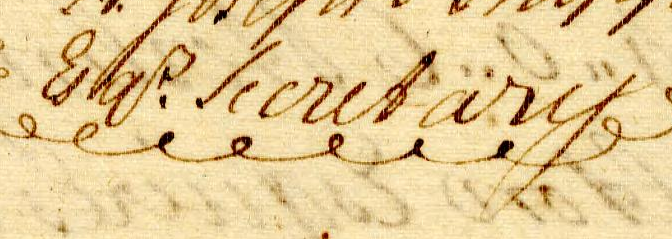Esq^r. Secretary
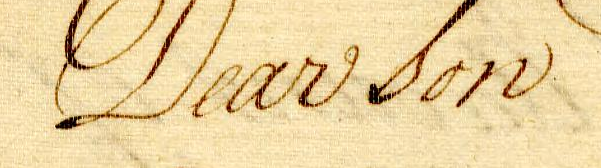Dear Son
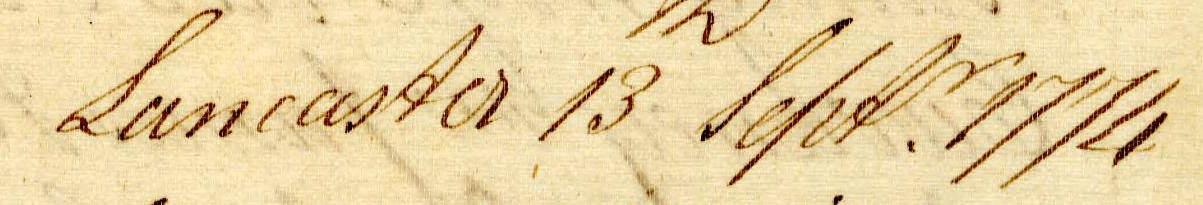Lancaster 13^th Sept^r. 1774
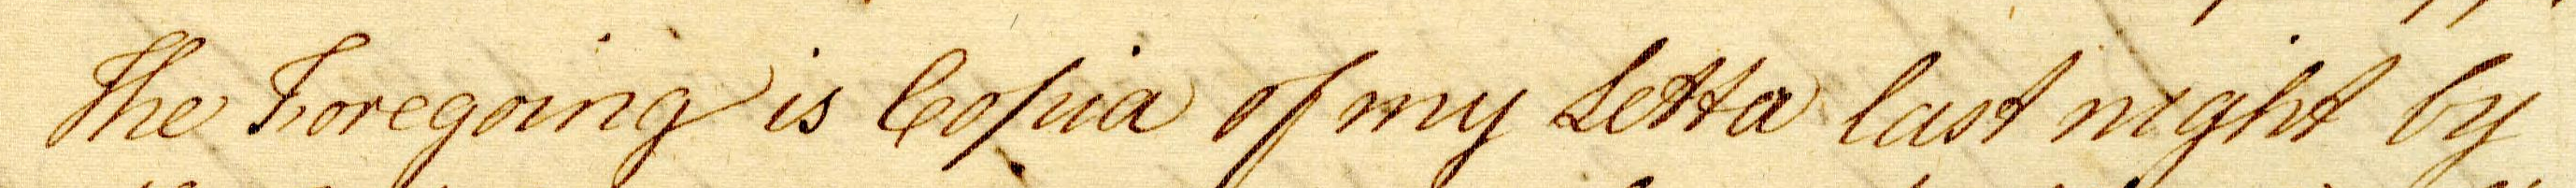The Foregoing is Copia of my Letter last night by
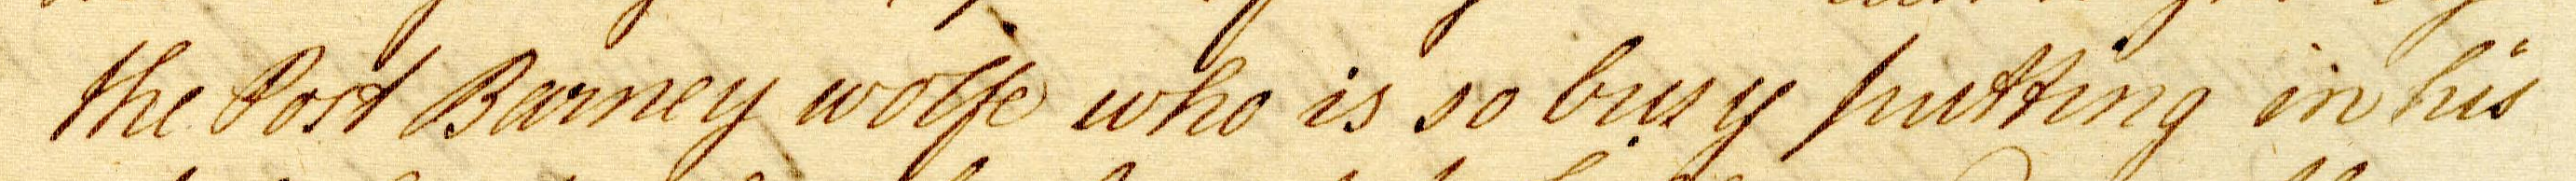the Post Barney Wolfe who is so busy putting in his
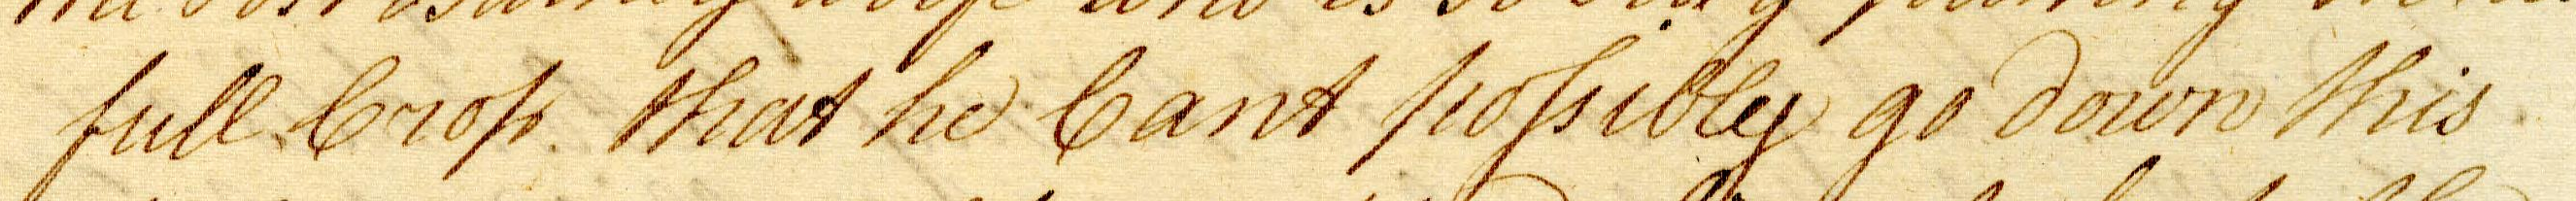full Cross that he Cant possibly go down this
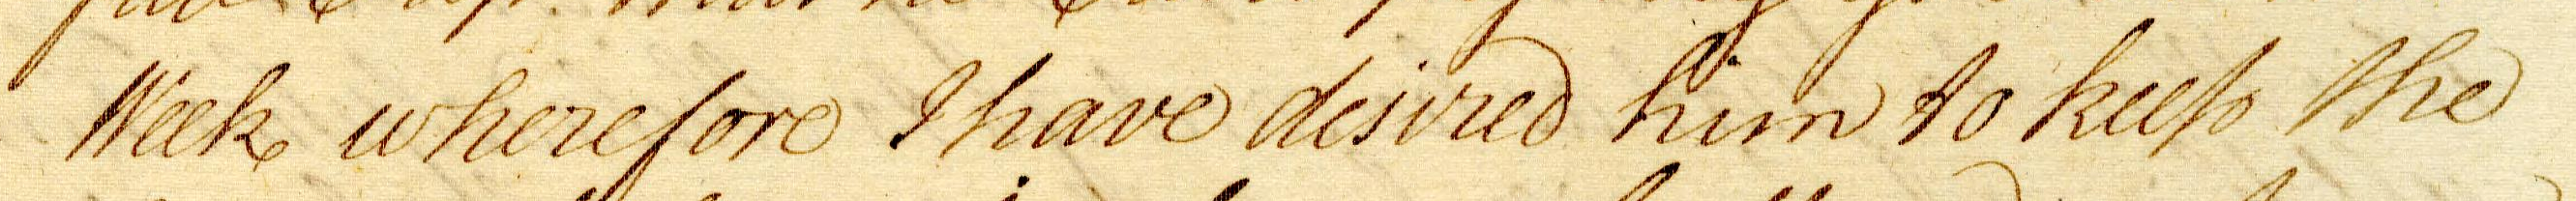Week wherefore I have desired him to keep the
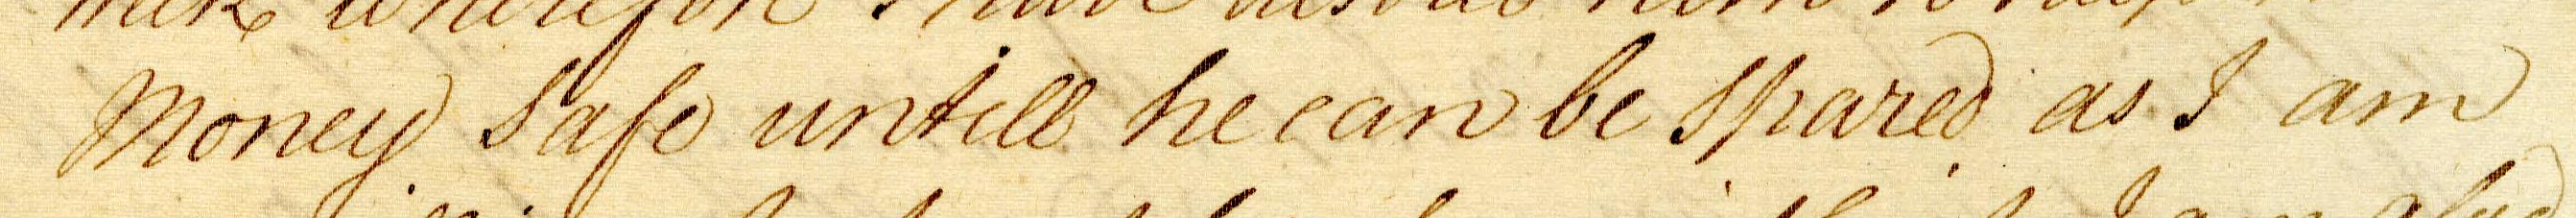Money Safe untill he can be spared as I am
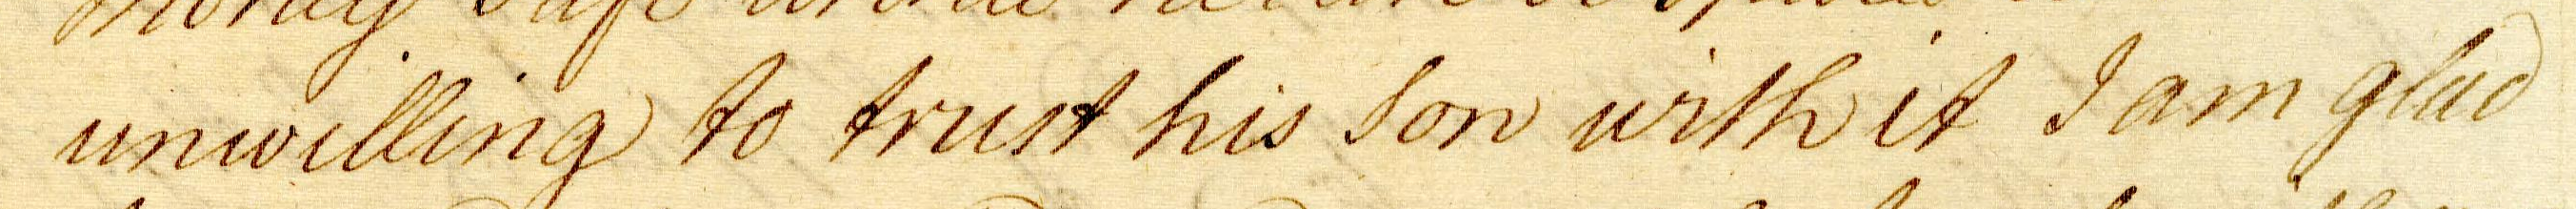unwilling to trust his Son with it I am glad
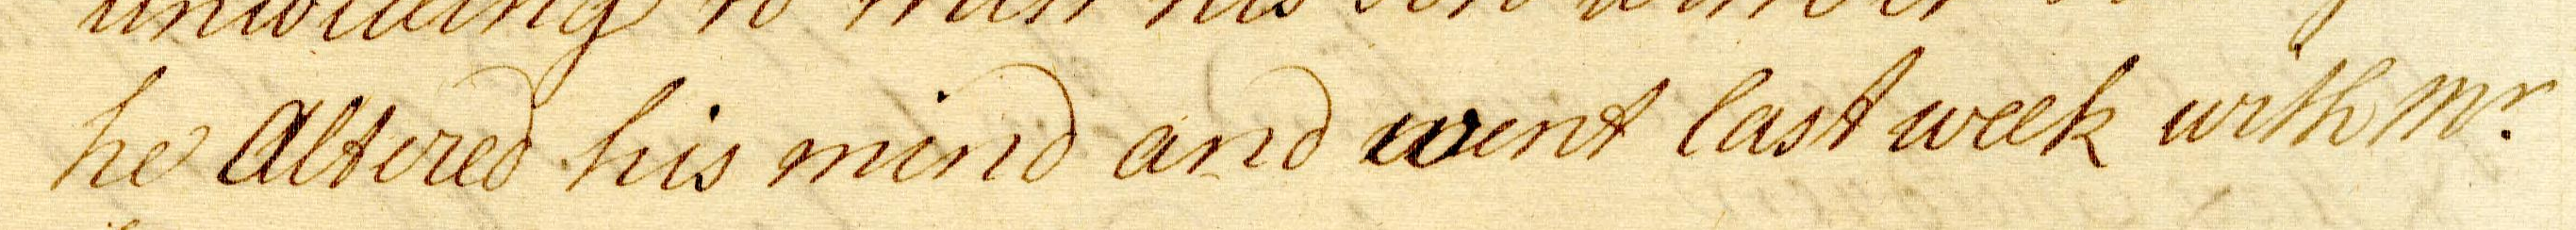he Altered his mind and went last week with M^r.
